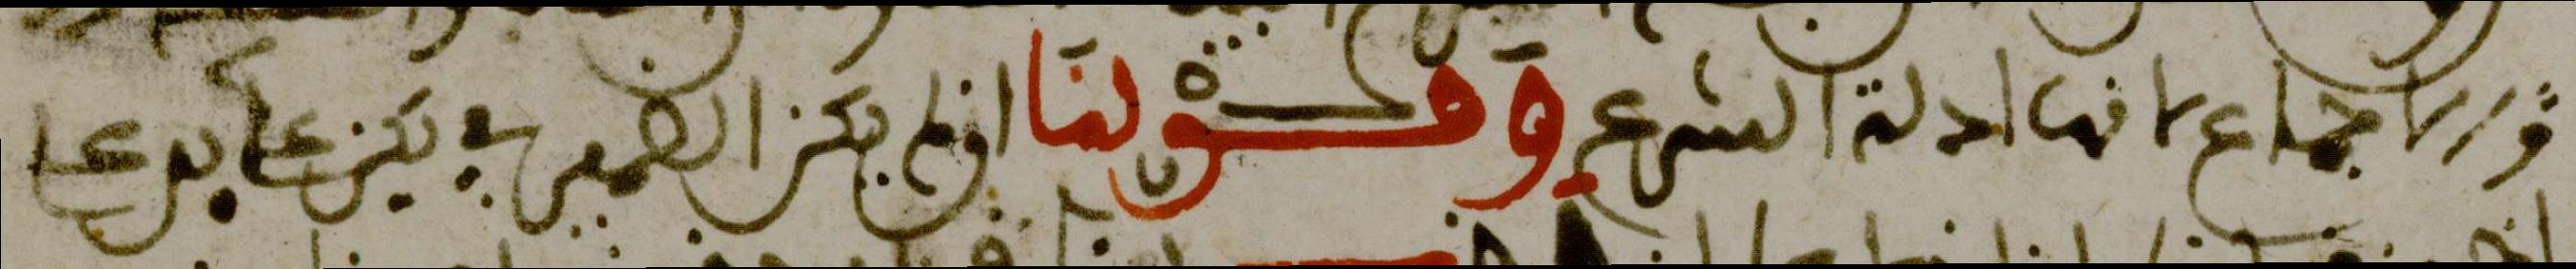والاجماع لانها ادلة الشرع وَقَوْلنَا ان لم يكن الضمير في يكن عائد على
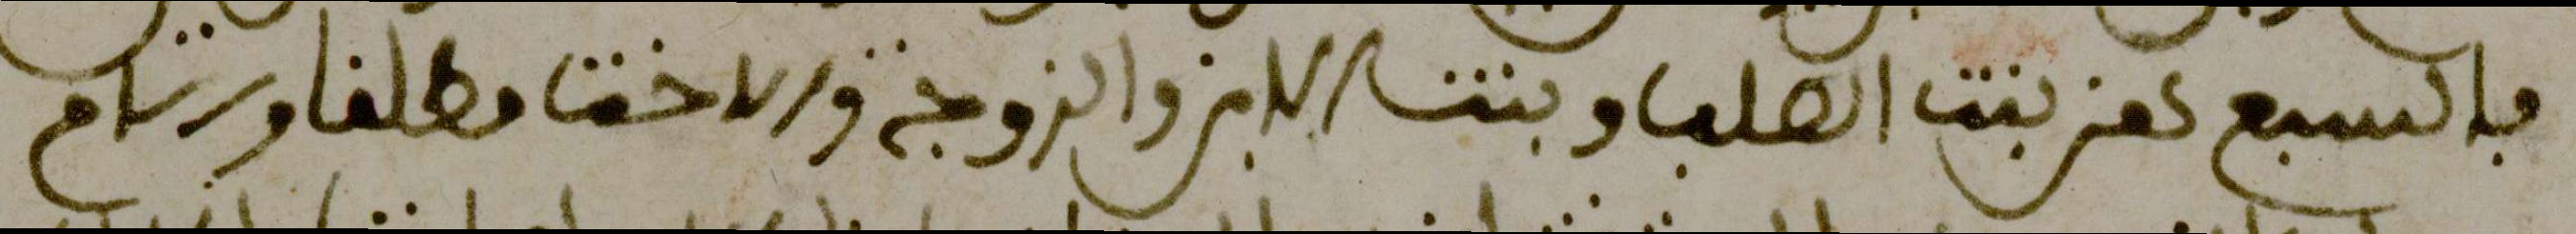فالسبع هن بنت الصلب وبنت الابن والزوجة والاخت مطلقا والام
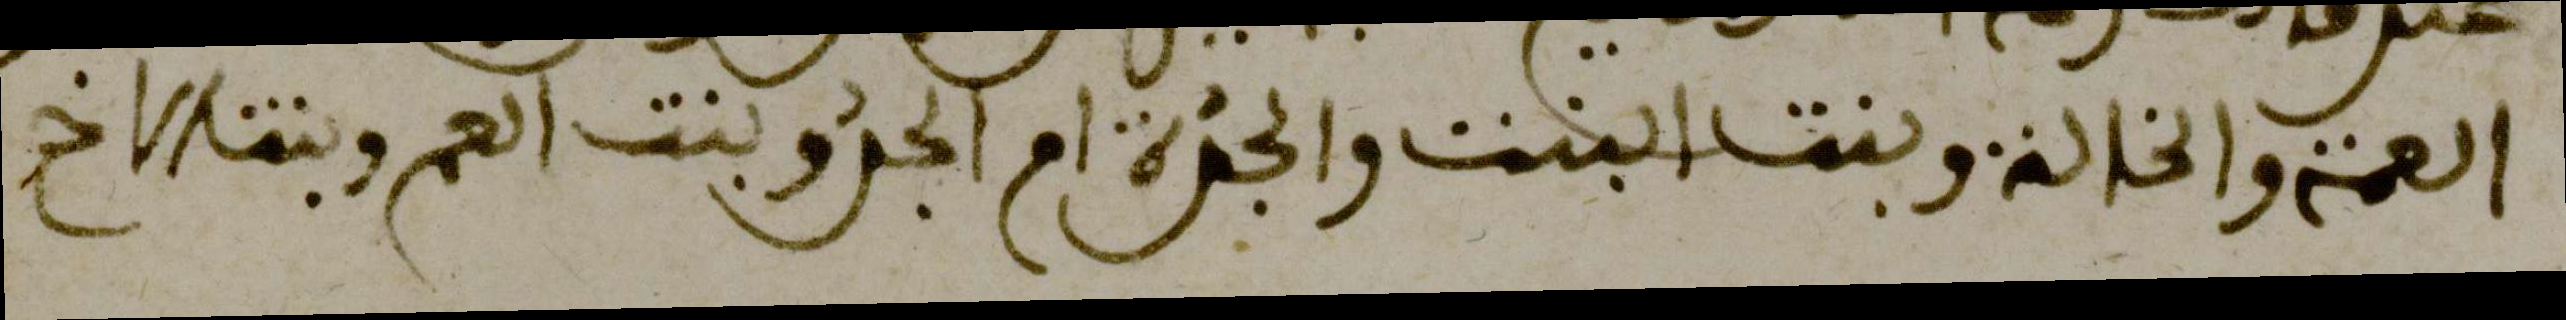العمة والخالة وبنت البنت والجدة ام الجد وبنت العم وبنت الاخ
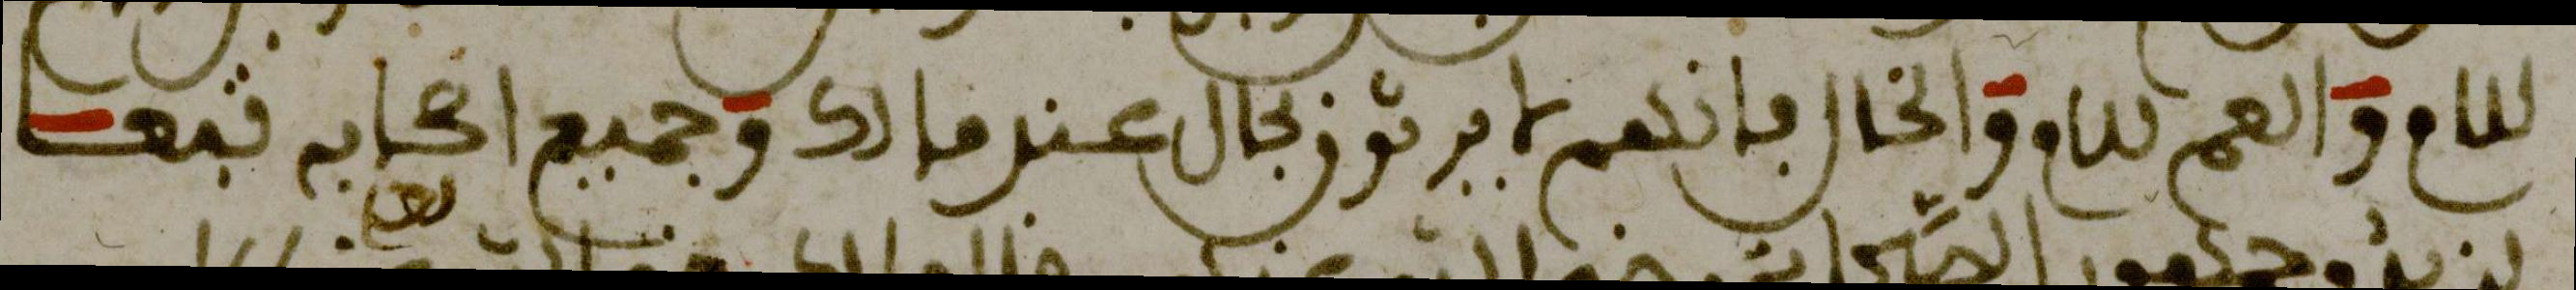للام وَالعم للام وَالخال فانهم لا يرثون بحال عند مالك وَجميع اصحابه تبعا
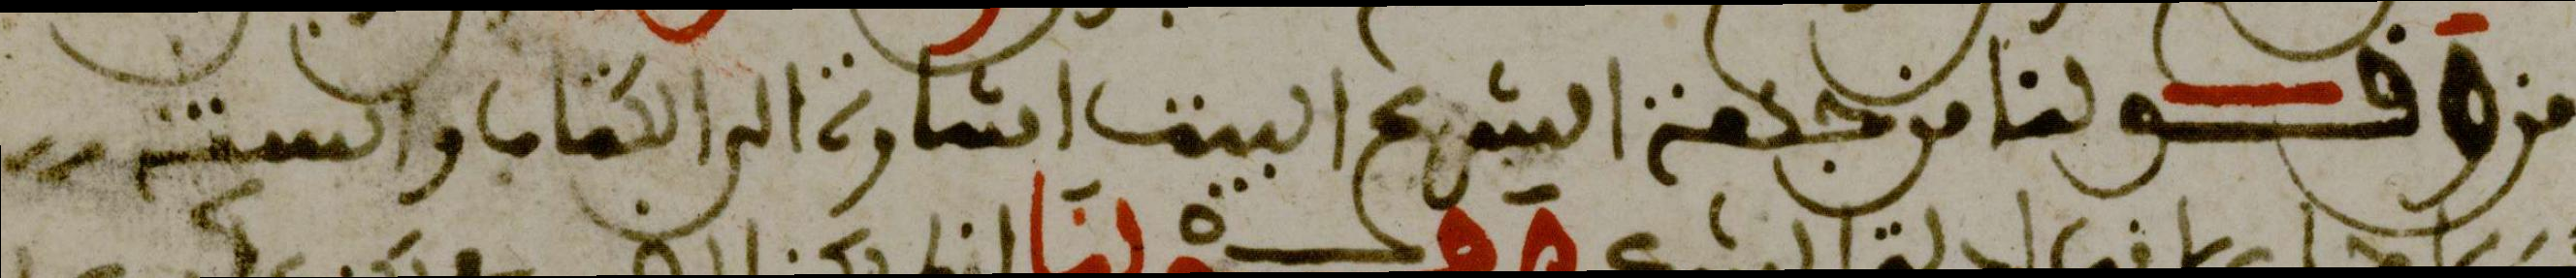من وَقَولنا من جهة الشرع البيت اشارة الى الكتاب والسنة
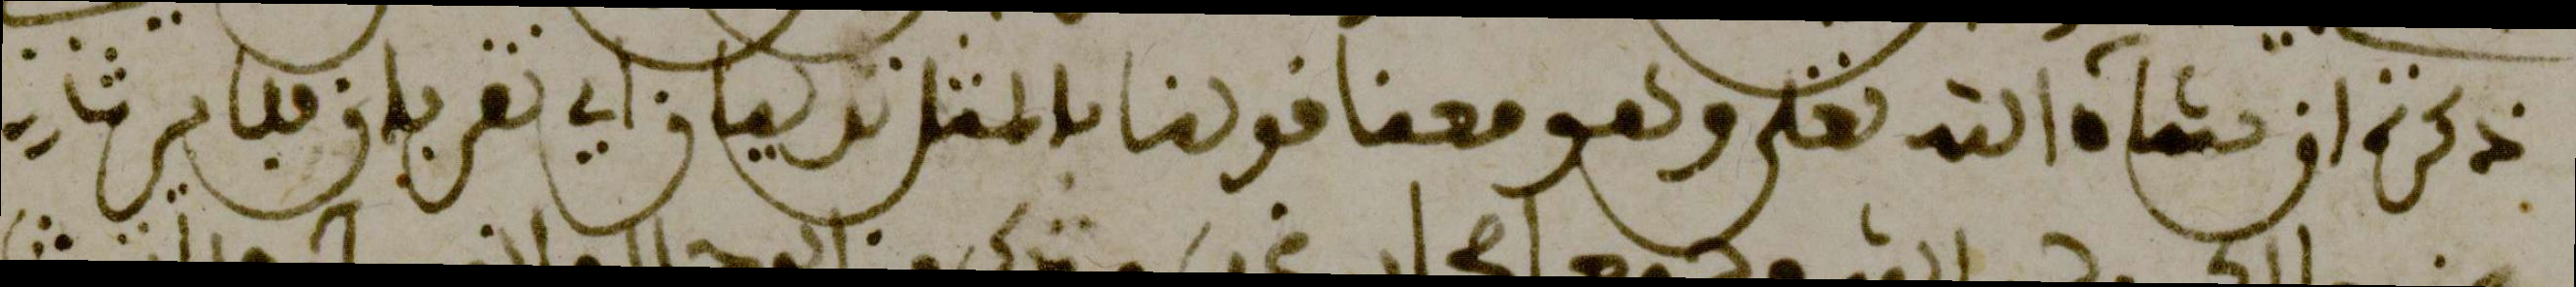ذكرة ان شاء الله تعلى وهو معنا قولنا بالمثل تدليان اي تقربان فلا يرث
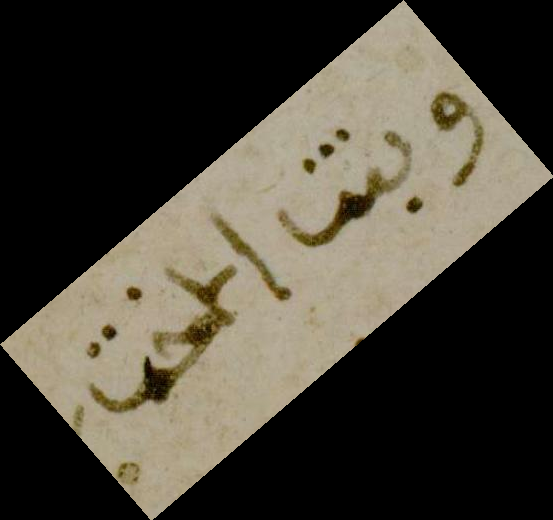وبنت الاخت
